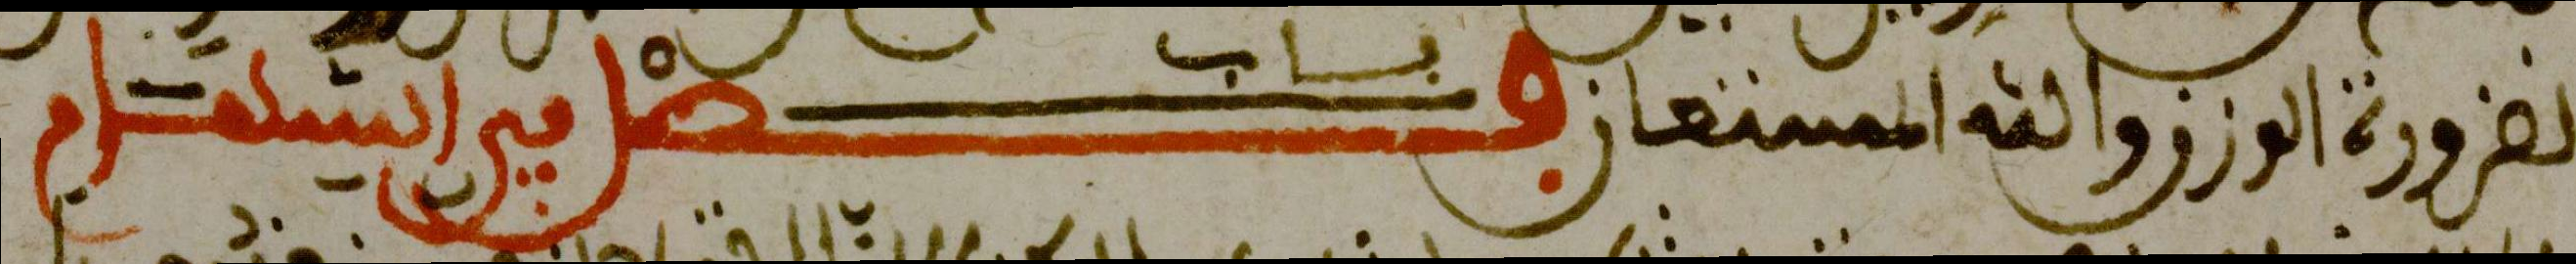لضرورة الوزن والله المستعان باب فصل في السهام
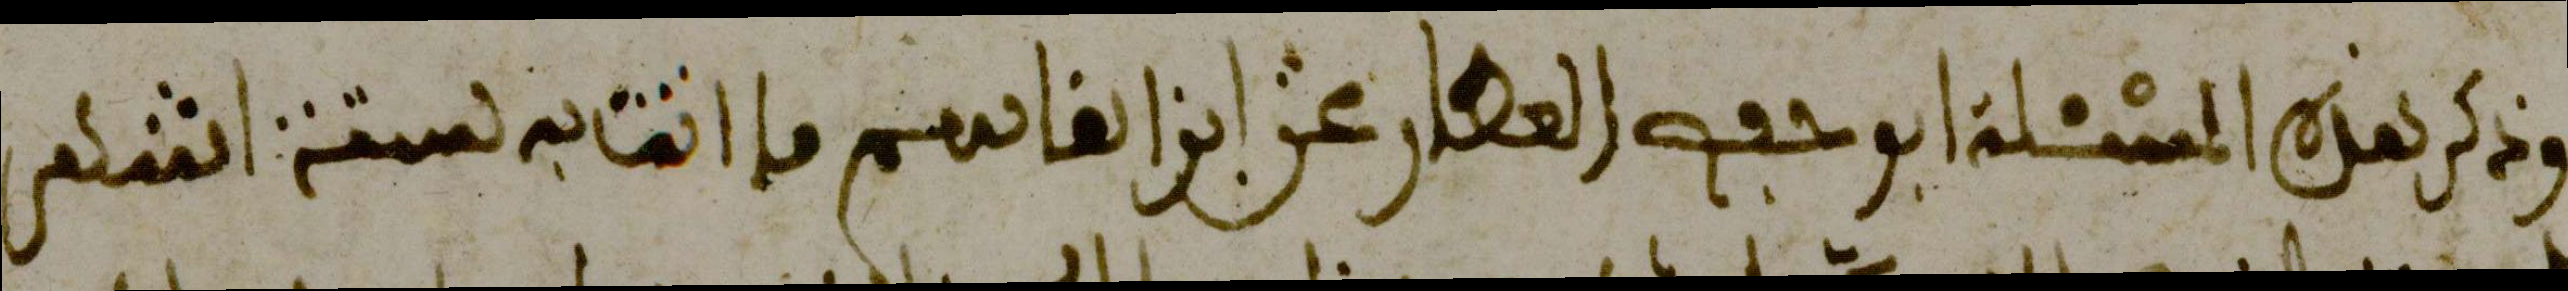وذكر هذا المسْئلة ابو حفص العطار عن ابن القاسم ما اتت به لستة اشهر
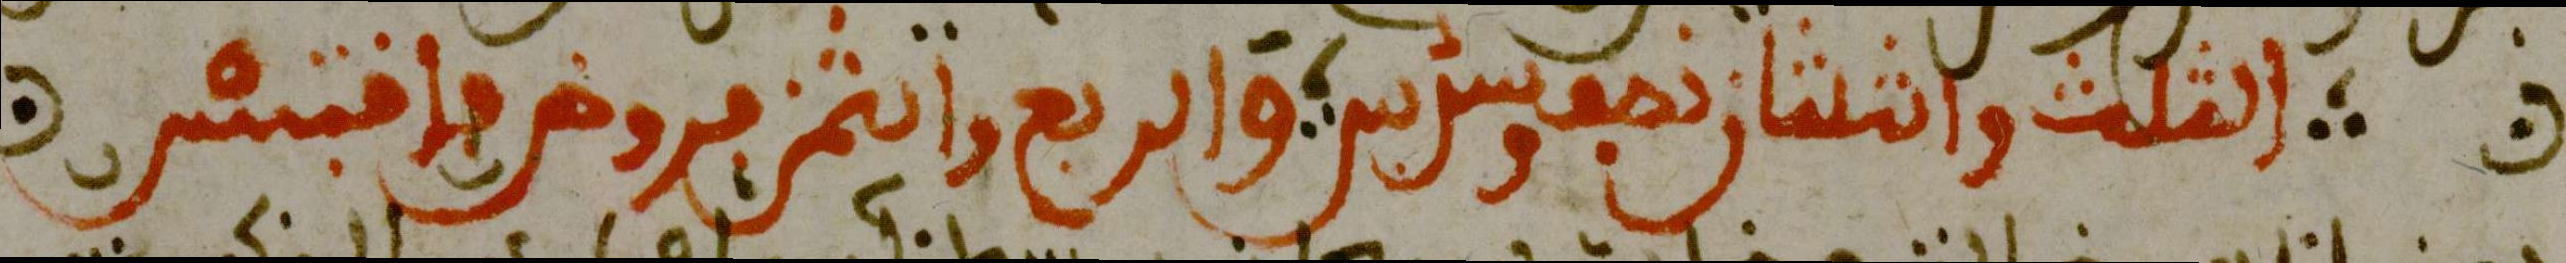الثلث والثلثان نصف وسدس والربع والثمن فروض فاقتبس
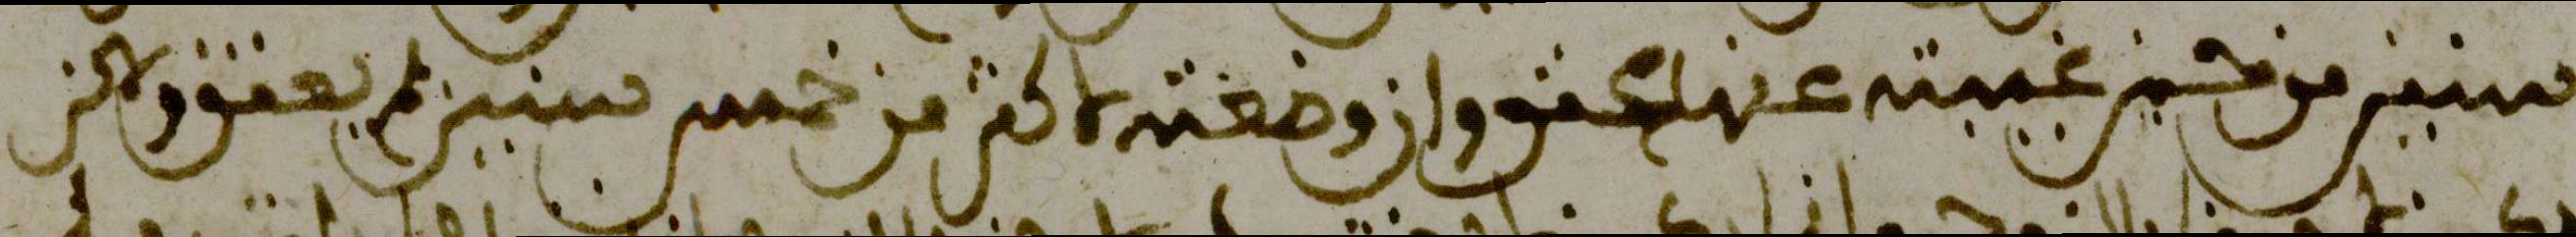سنين من حين غيبته عنها عتق وان وضعته لاكثر من خمس سنين لم يعتق ولاكن
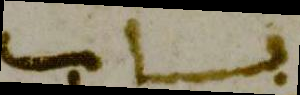باب
